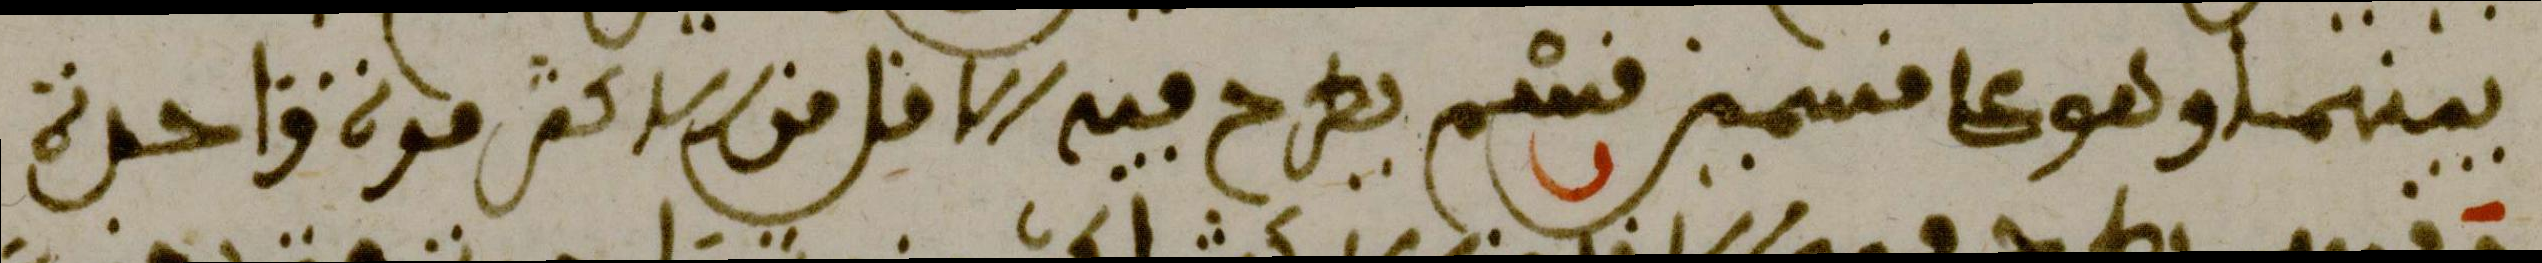بينما و هو على قسمين قسم يطرح فيه الاقل من الاكثر مرة واحدة
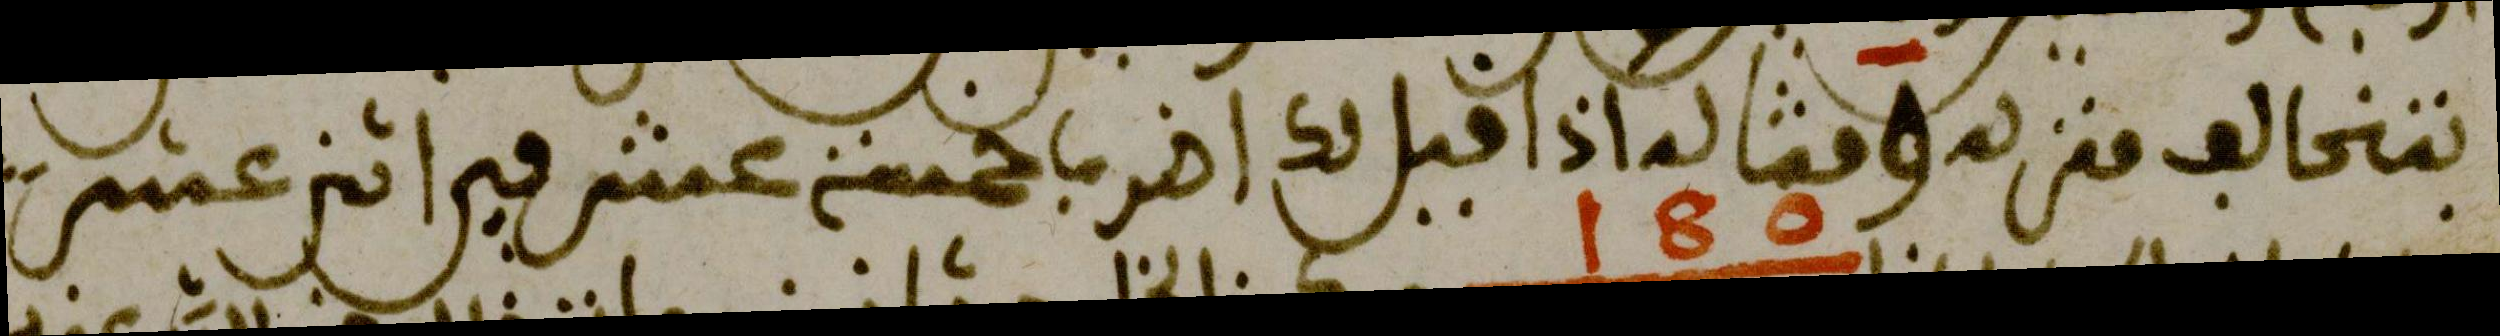بتخافل منزله و مثاله اذا قيل لك اضرب خمسة عشر في اثنى عشر
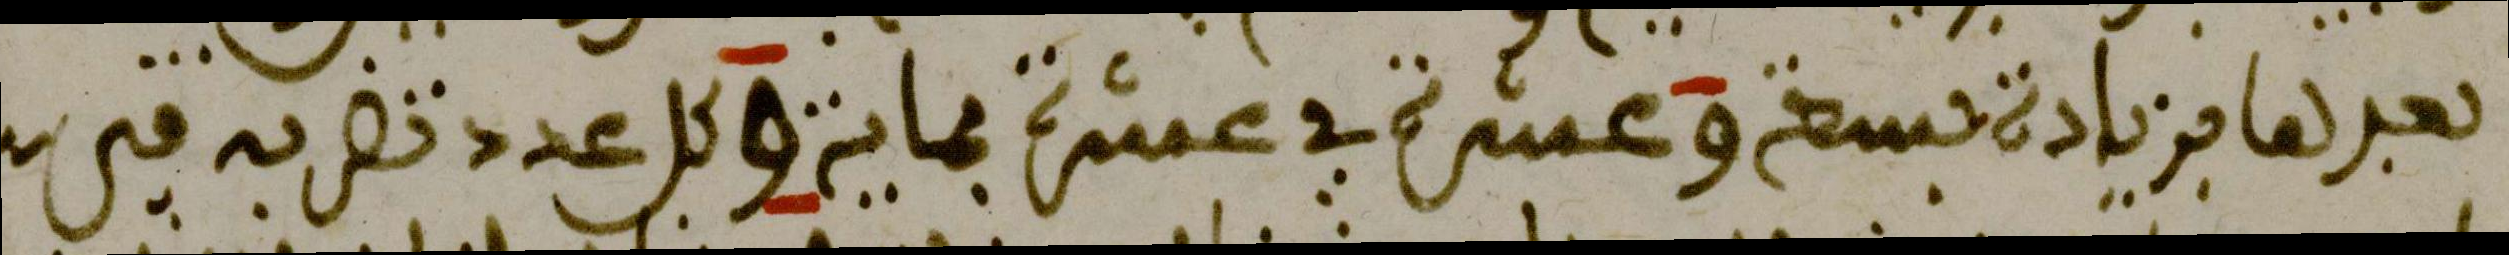بعدها بزيادة سبعة و عشرة في عشرة بماية و كل عدد تضربه في
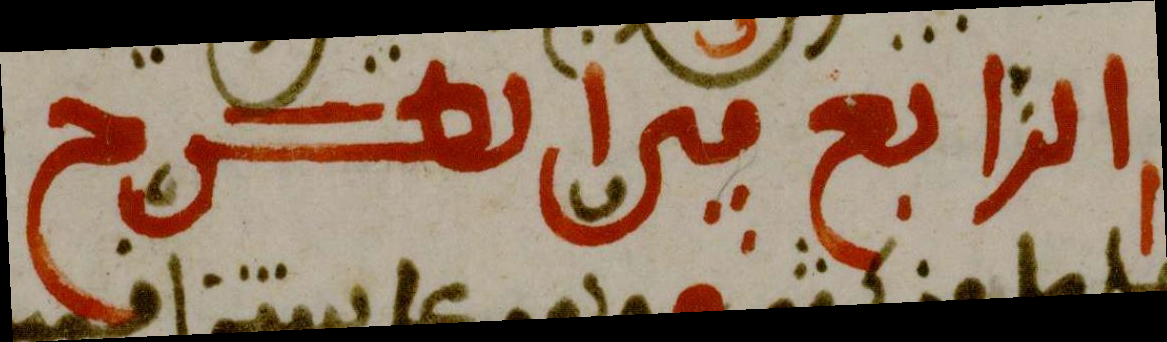الرابع في الطرح
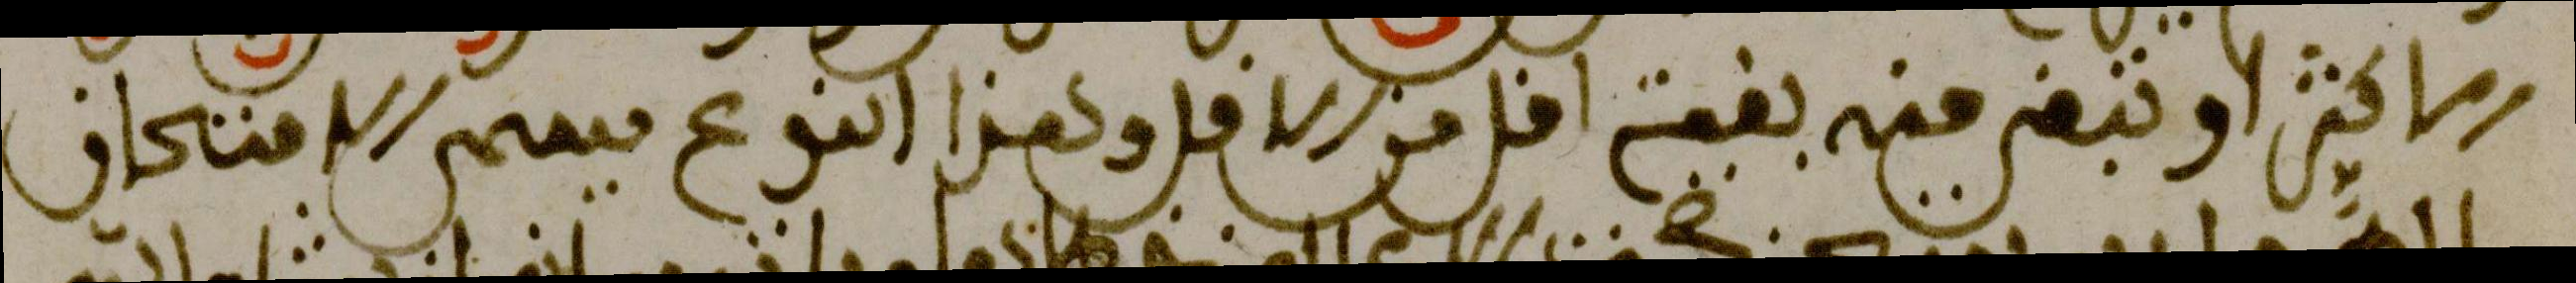الاكثر او تبقي منه بقية اقل من الاقل و هذا النوع يسمى الامتحان
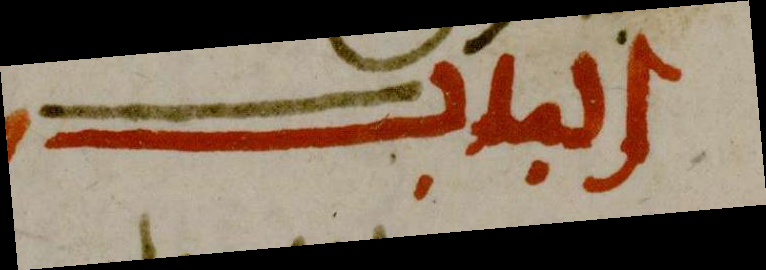الباب
